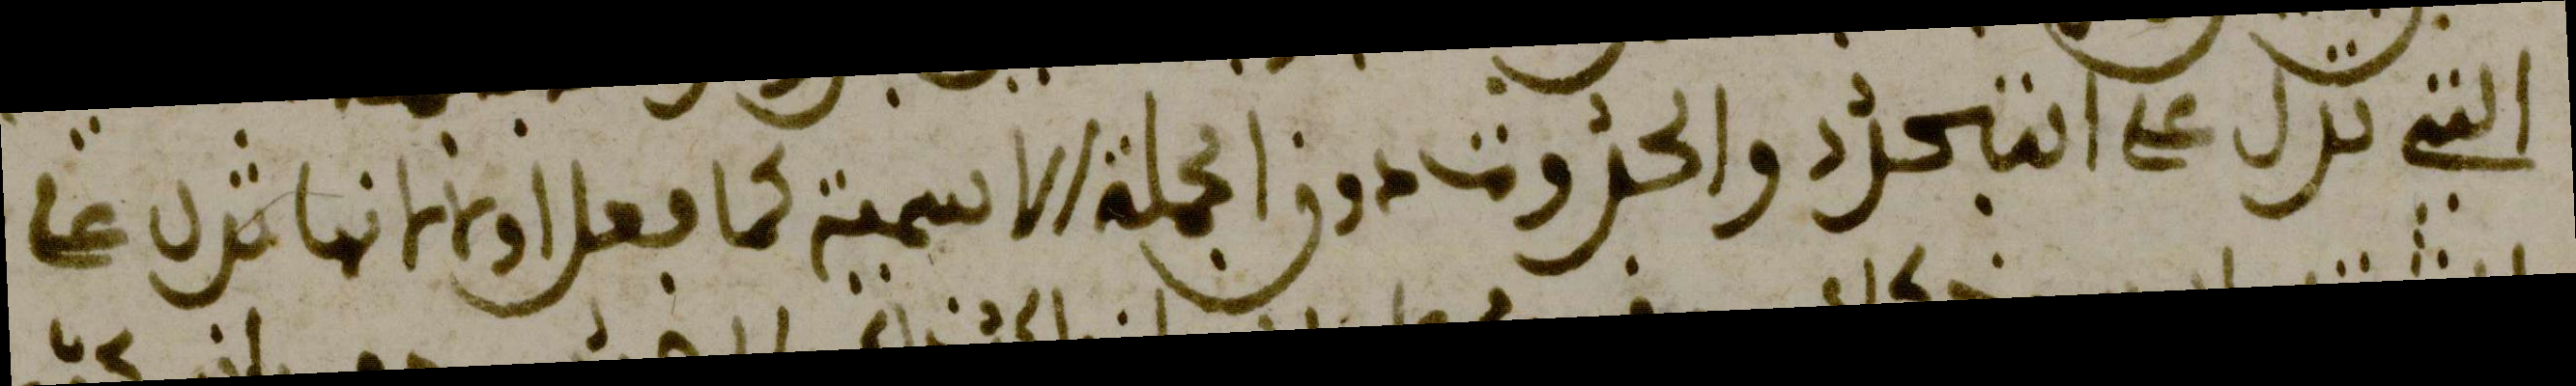التي تدل على التجدد والحدوث دون الجملة الاسمية كما فعل اولا لانها تدل على
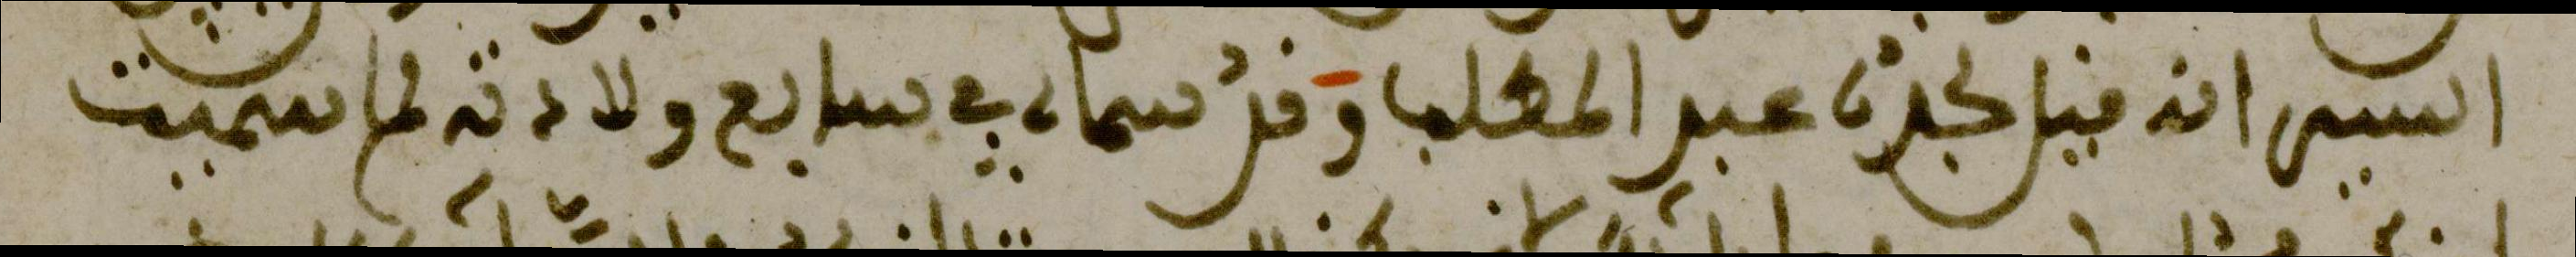السير انه قيل الجده عبد المطلب وَقد سماه في سابع ولادته لم سميت
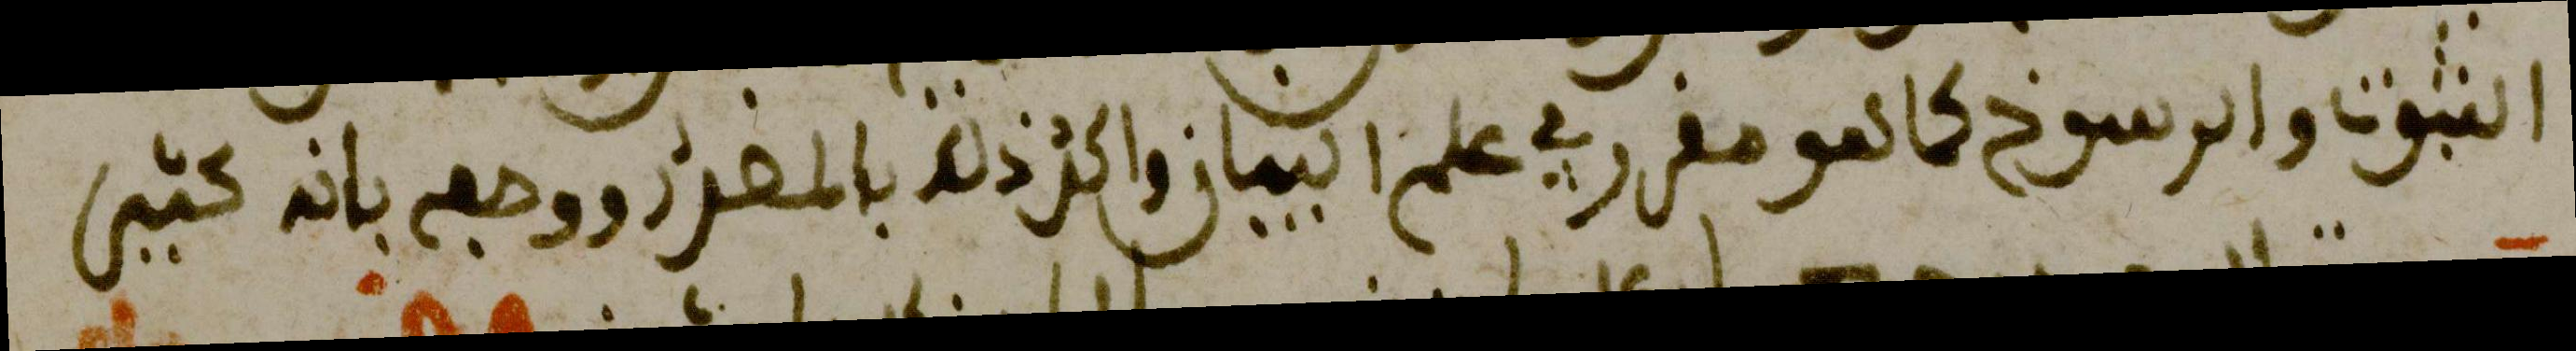الثبوت الرسوخ كما هو مقرر في علم اليمان واكد ذلك بالمصدر ووصفه بانه كثير
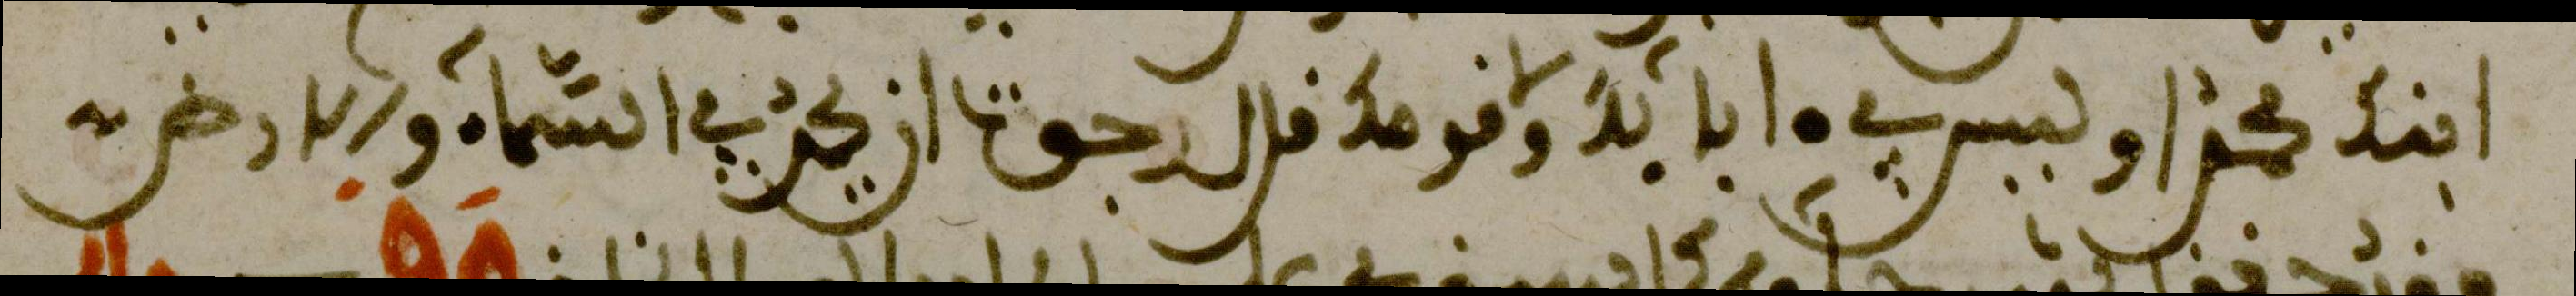ابنك محمد او ليس في ءابائك ولا قومك قال رجوت ان يحمد في السّماء والارض
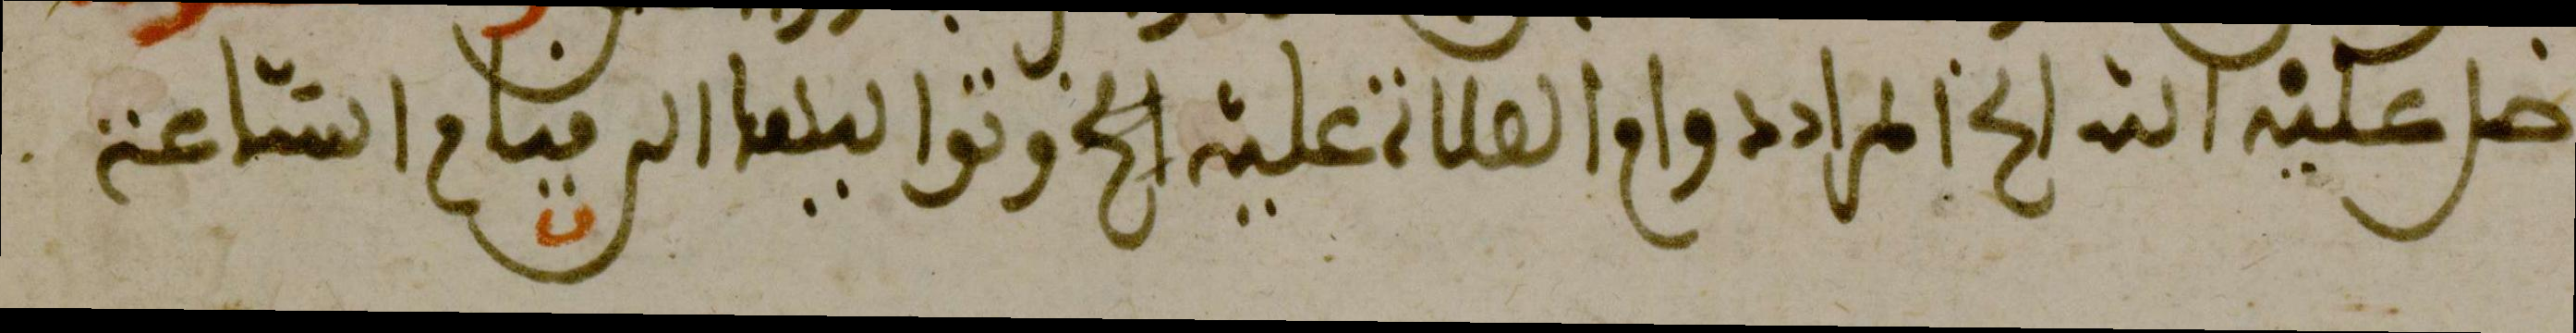صل عليْه الله الخ المراد دوام الصلاة عليْه الخ وتواليها الى قيام السّاعة
